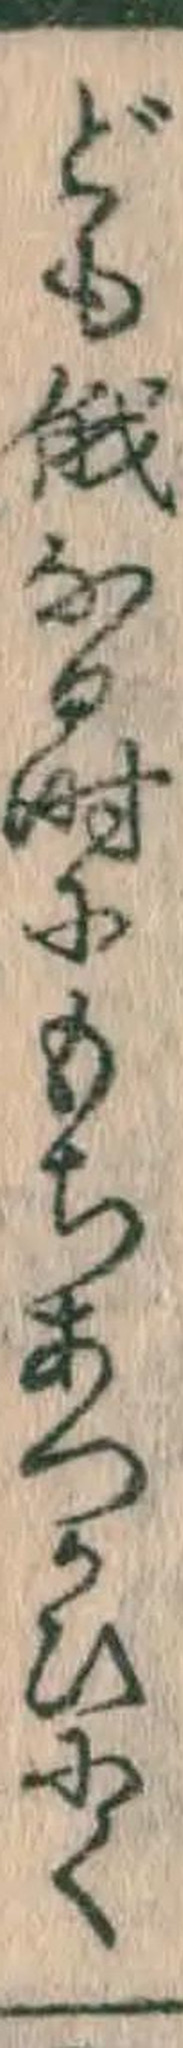ども俄なる時にもちあつかひにく
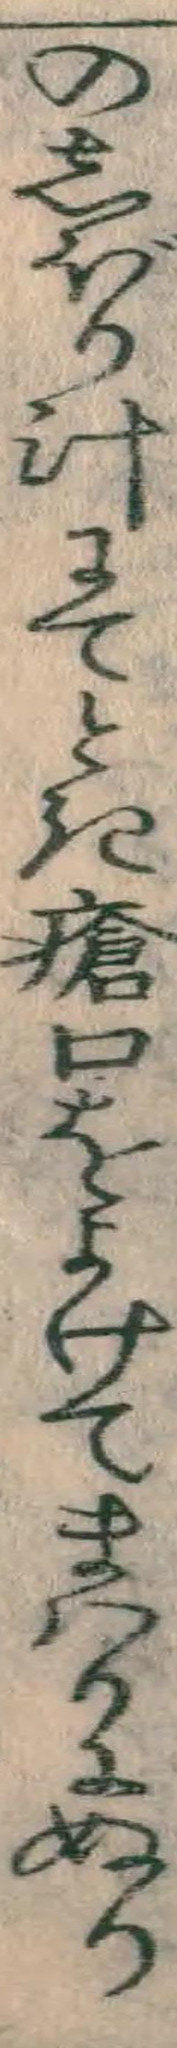のしぼり汁にてとき瘡口をよけてまはりにぬり
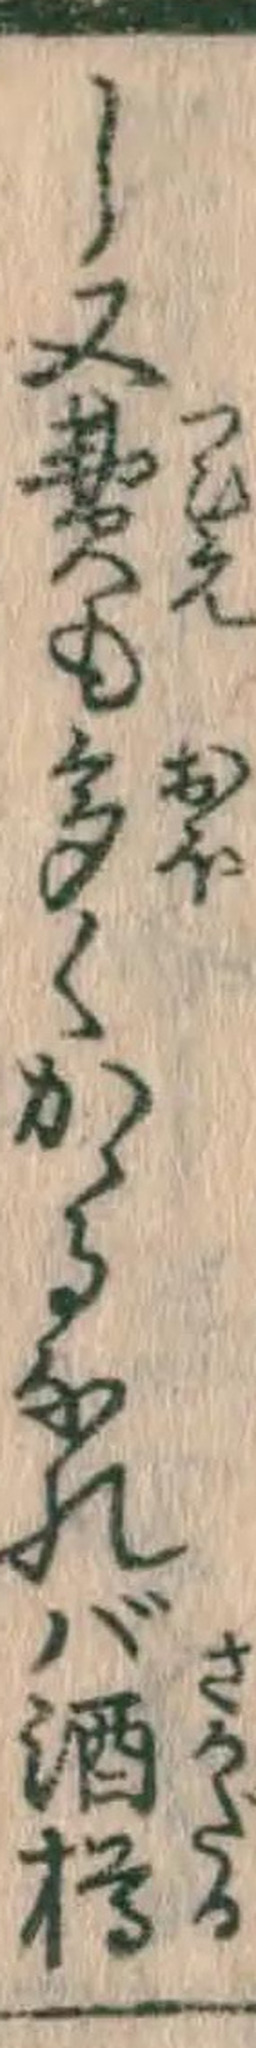し又費も多くかゝるなれば酒樽
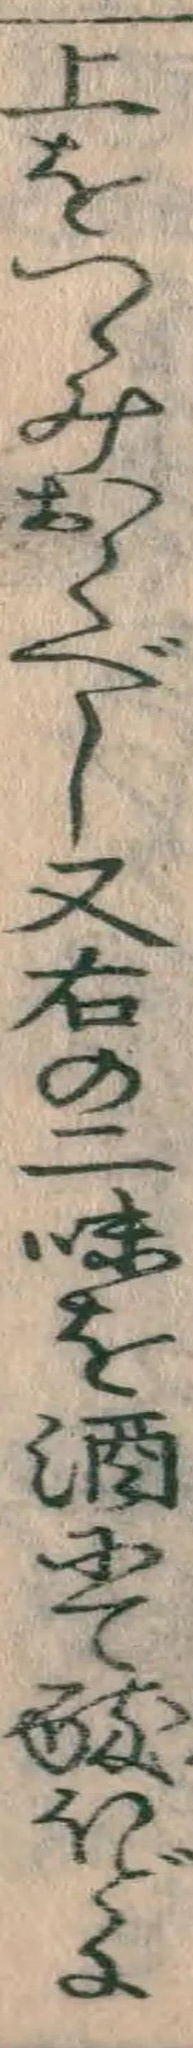上をつゝみおくべし又右の二味を酒にて酔ほどに
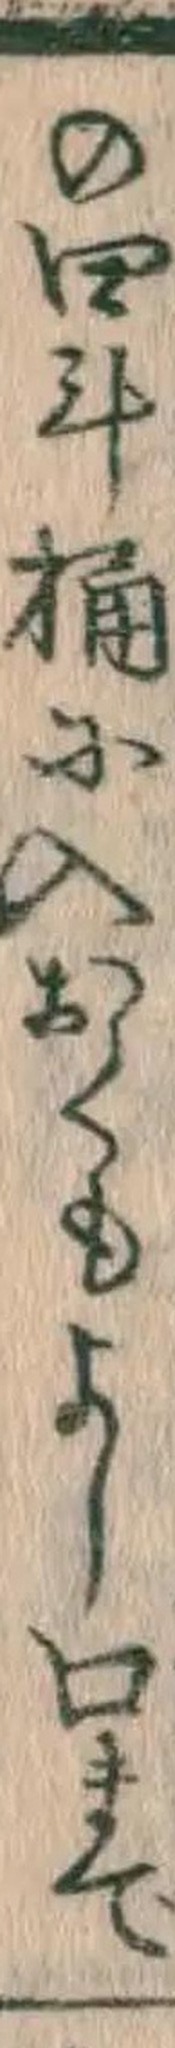の四斗桶に入おくもよし口まで
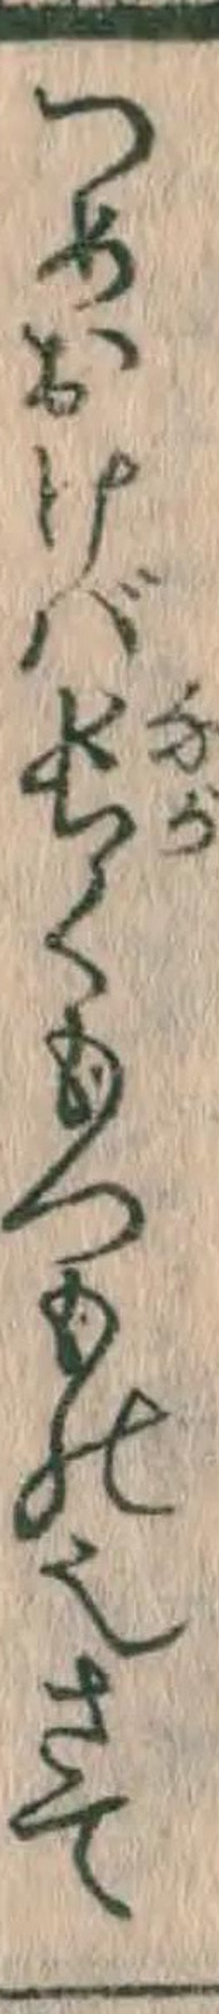つめおけば長くもつもの也さて
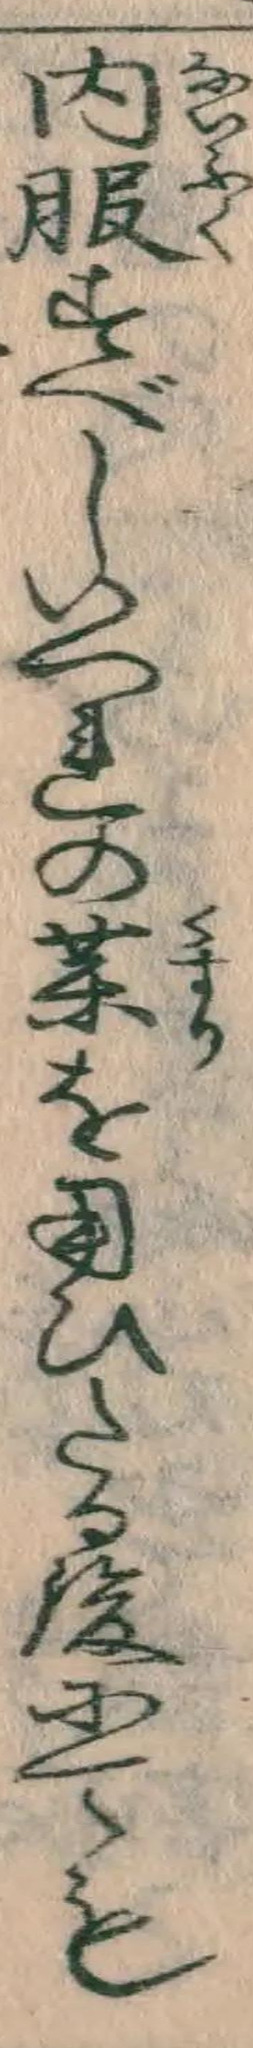内服すべしいつれの薬を用ひたる後にても
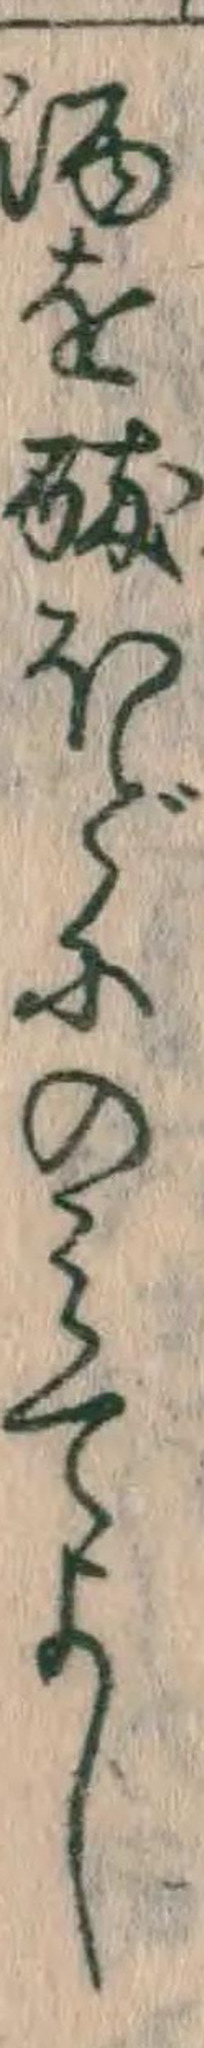酒を酔ほどにのみてよし
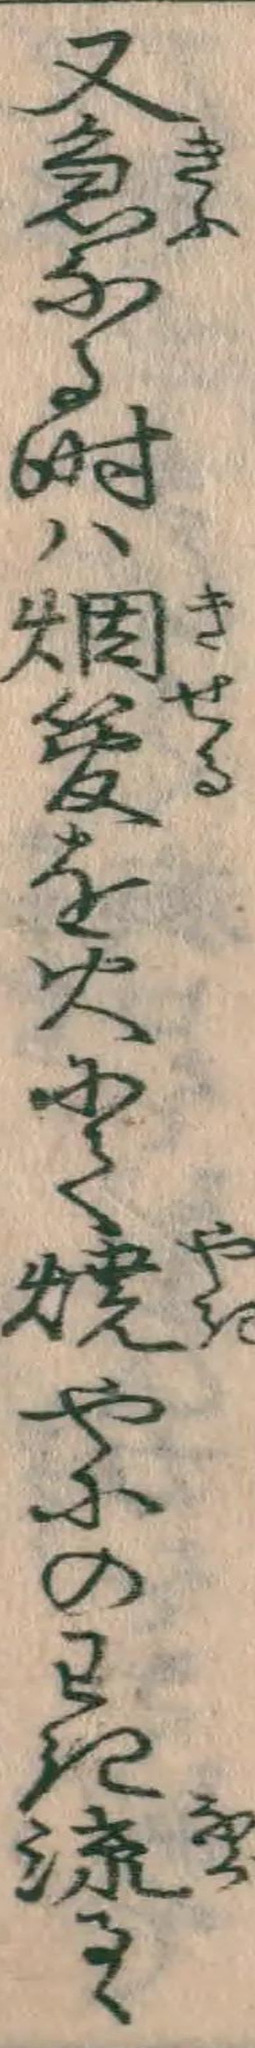又急なる時は烟管を火にて焼やにのわき流るゝ
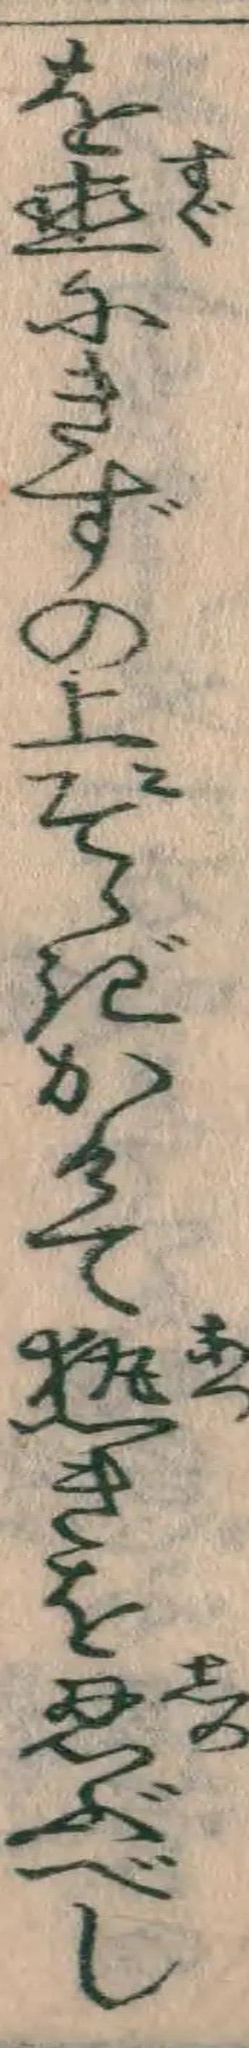を直にきずの上にそゝぎかけて熱きを忍ぶべし
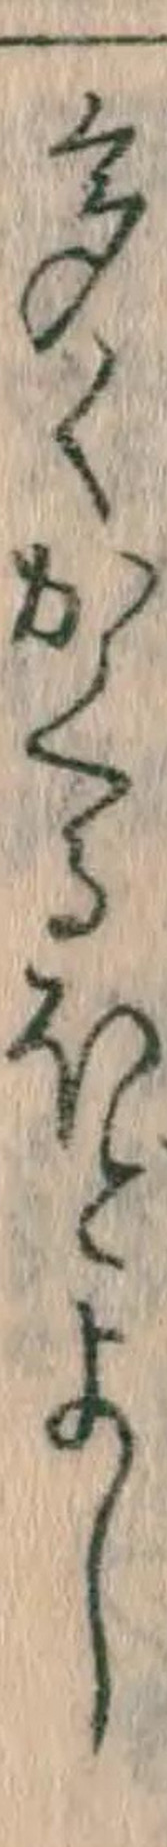多くかくるほどよし
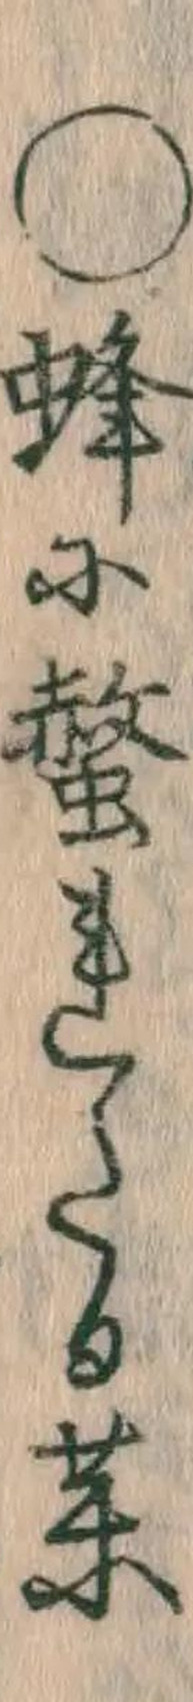○蜂に螫れたる薬
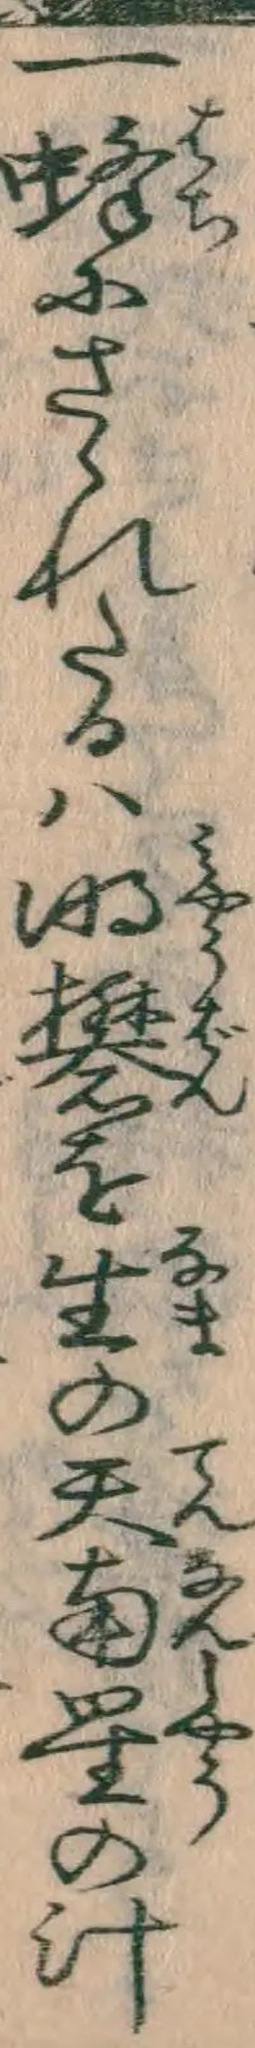一蜂にさゝれたるは明礬を生の天南星の汁
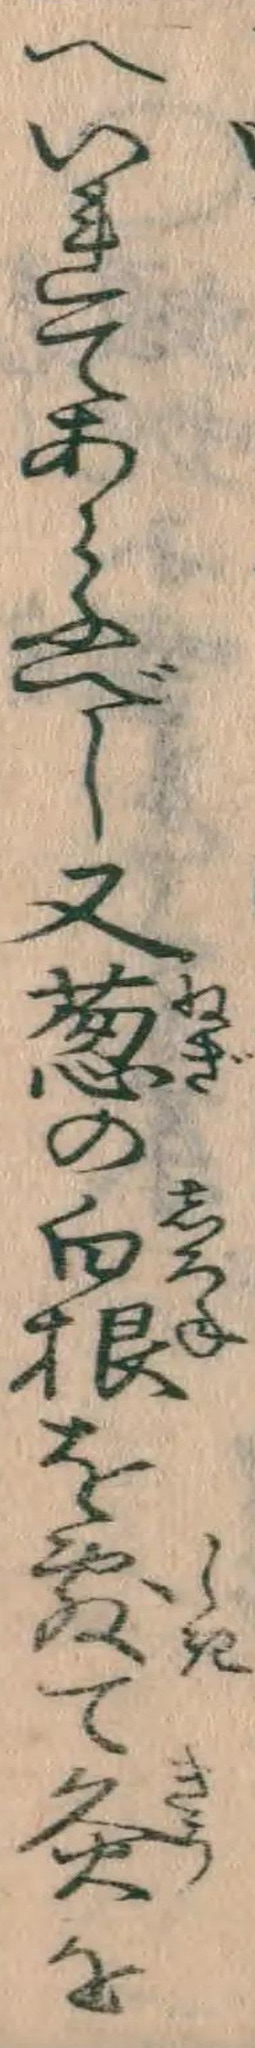へいれてあらふべし又葱の白根を敷て灸を
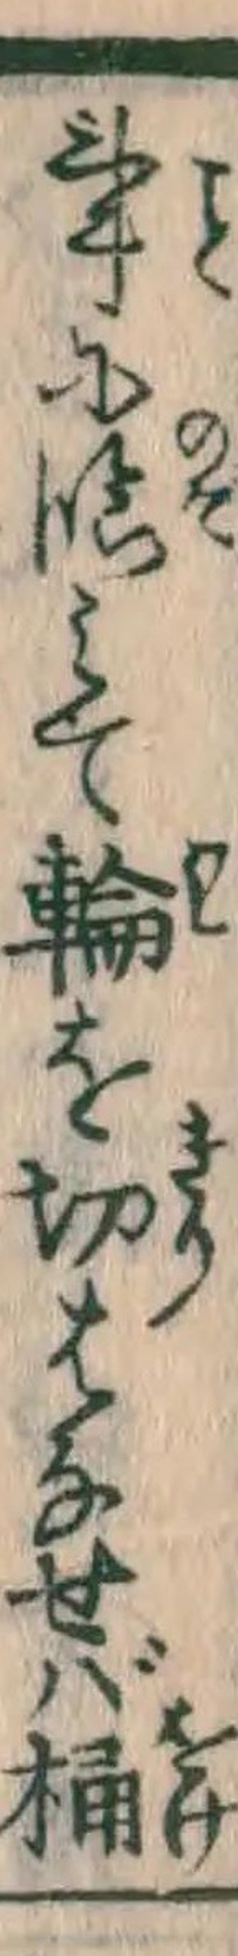事に臨みて輪を切はなせば桶
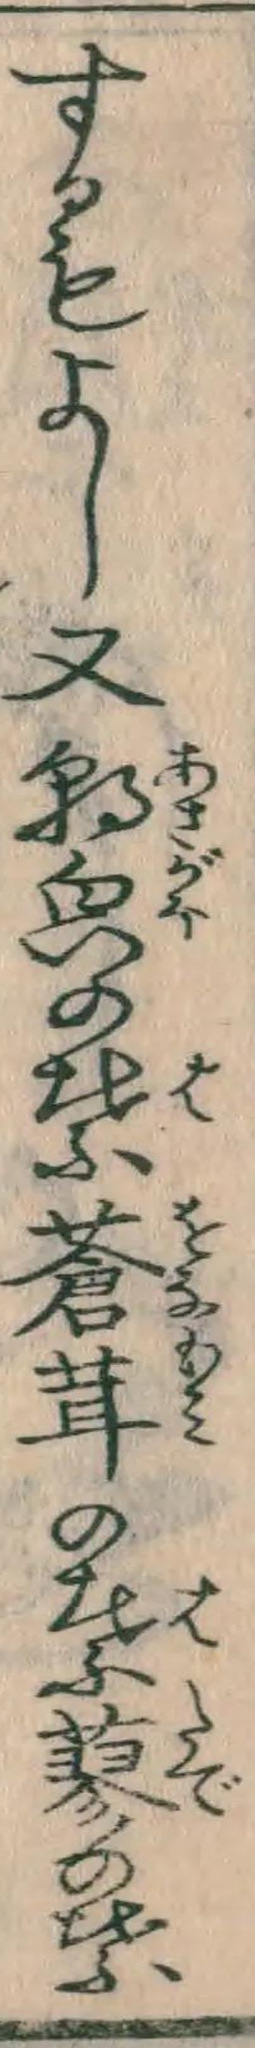するもよし又朝貌の葉蒼茸の葉蓼の葉
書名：広益秘事大全 3巻. [3]
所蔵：国立国会図書館 National Diet Library, JAPAN
